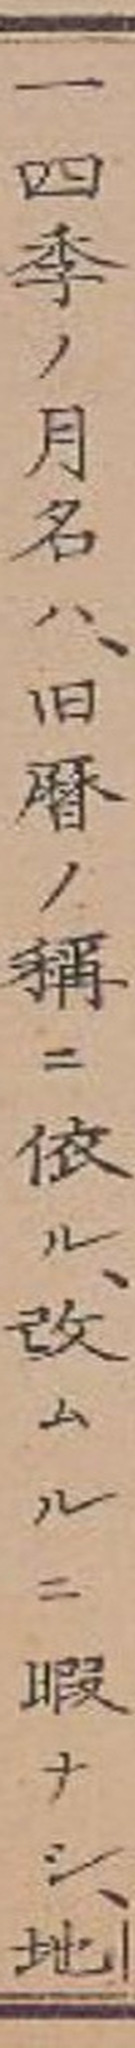一四季ノ月名ハ、旧暦ノ称ニ依ル、改ムルニ暇ナシ、地
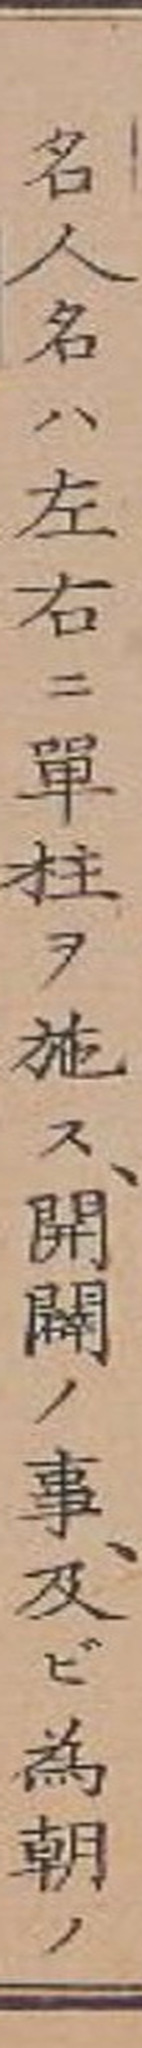名人名ハ左右ニ単柱ヲ施ス、開闢ノ事、及ビ為朝ノ
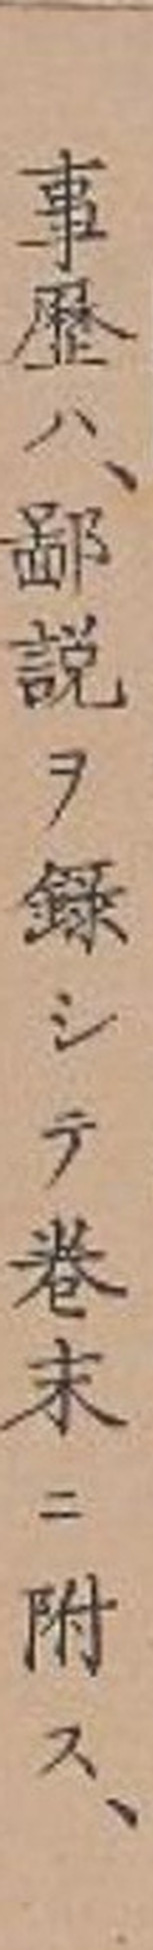事歴ハ、鄙説ヲ録シテ巻末ニ附ス、
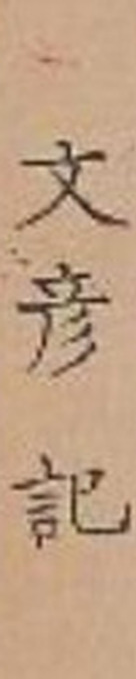文彦記

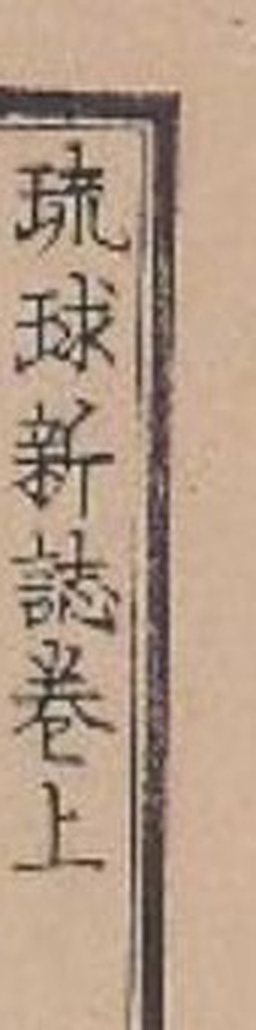琉球新誌巻上
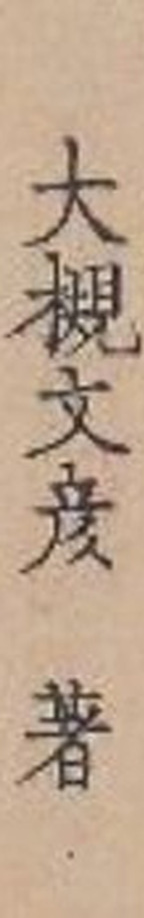大槻文彦著
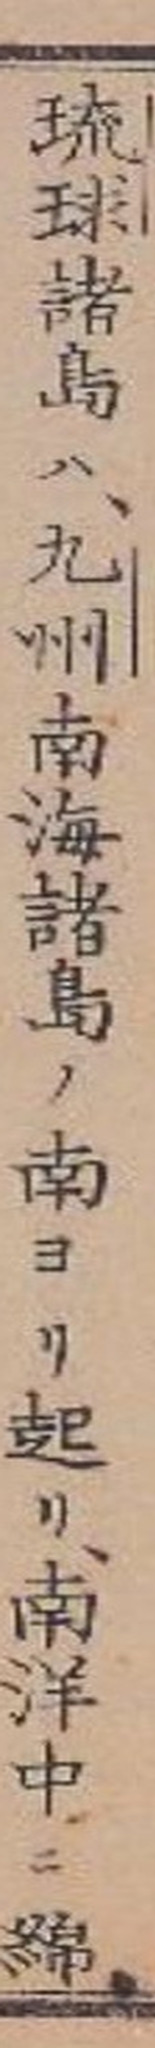琉球諸島ハ、九州南海諸島ノ南ヨリ起リ、南洋中ニ綿
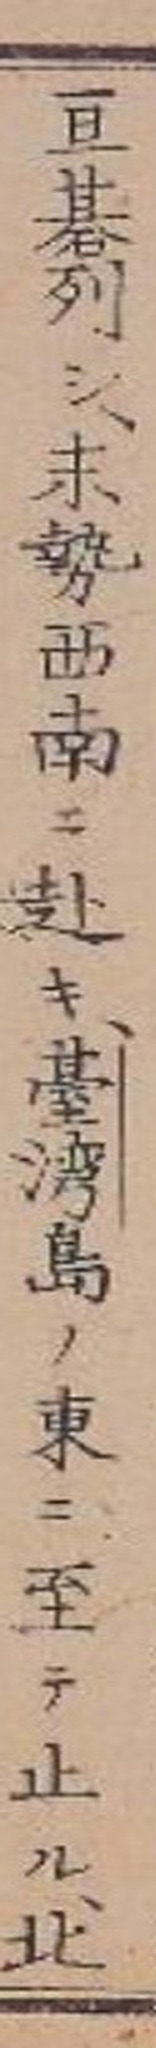亘碁列シ、末勢西南ニ赴キ、台湾島ノ東ニ至テ止ル、北
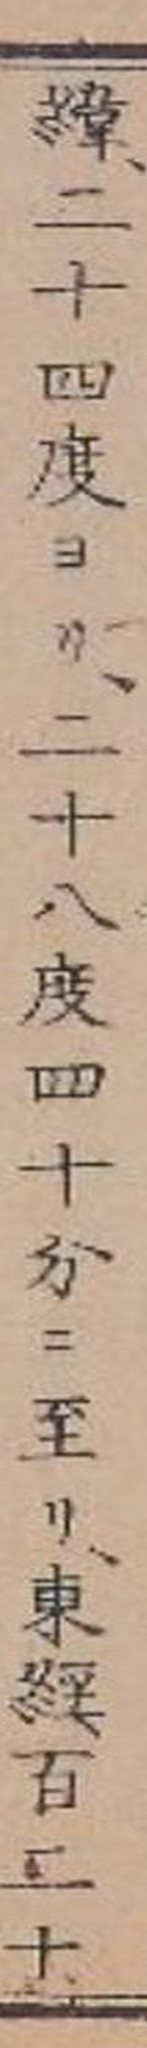緯、二十四度ヨリ、二十八度四十分ニ至リ、東経、百二十
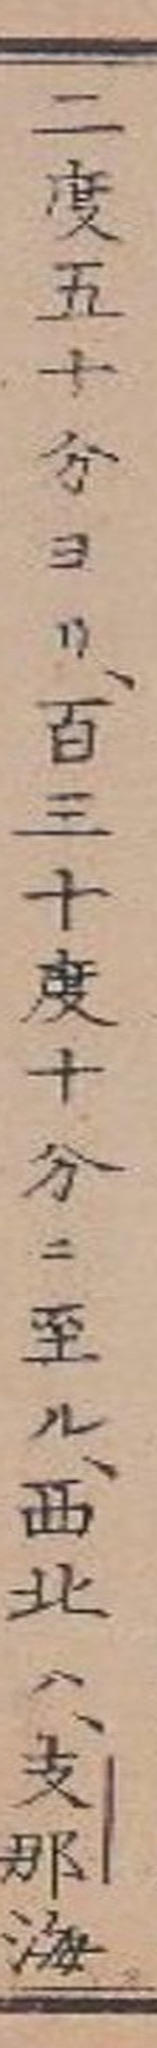二度五十分ヨリ、百三十度十分ニ至ル、西北ハ、支那海
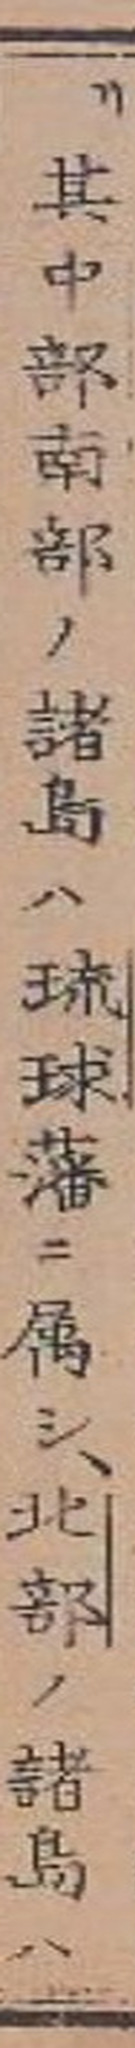リ其中部南部ノ諸島ハ琉球藩ニ属シ、北部ノ諸島ハ

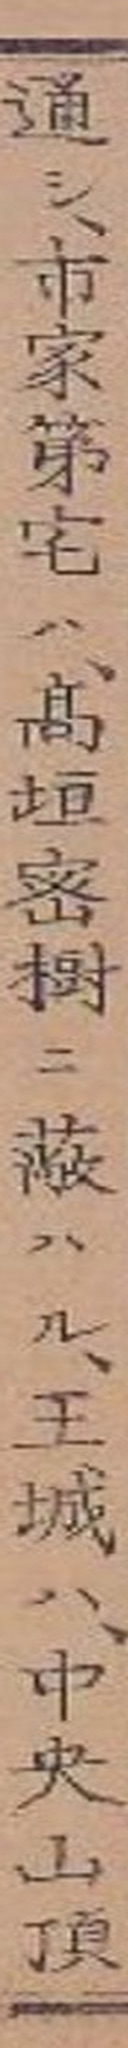通シ、市家第宅ハ、高垣密樹ニ蔽ハル、王城ハ、中央山頂
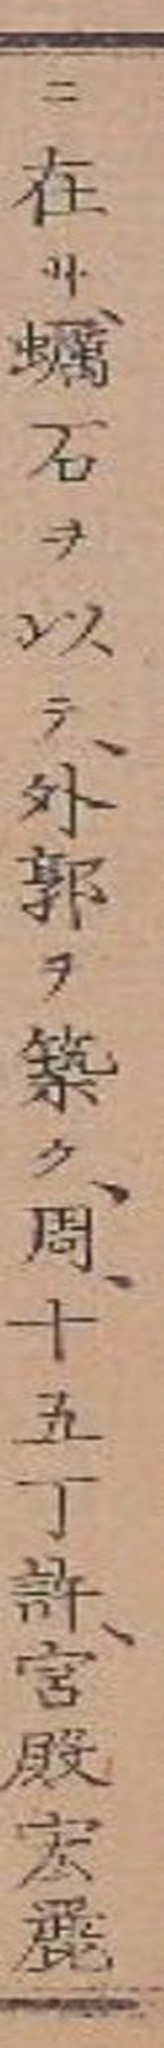ニ在リ、蠣石ヲ以テ、外郭ヲ築ク、周、十五丁許、宮殿宏麗
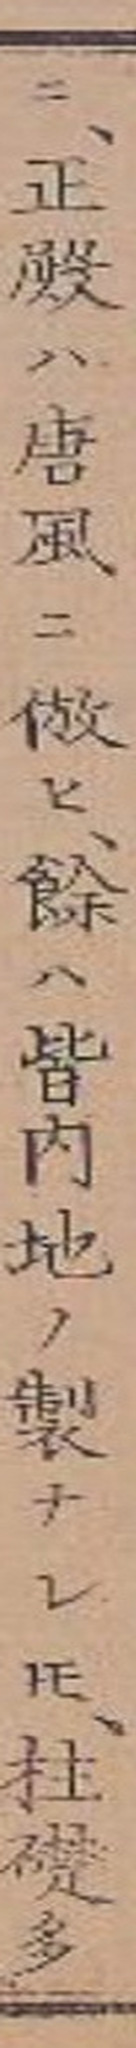ニ、正殿ハ唐風ニ倣ヒ、余ハ皆内地ノ製ナレトモ、柱礎多
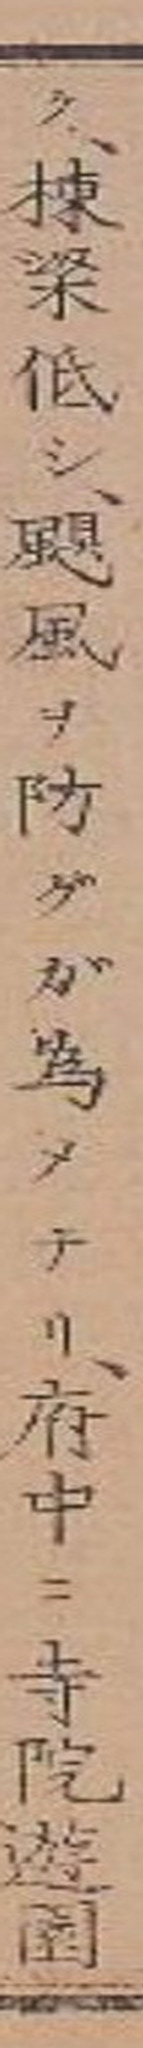ク、棟梁低シ、颶風ヲ防グガ為メナリ、府中ニ寺院遊園
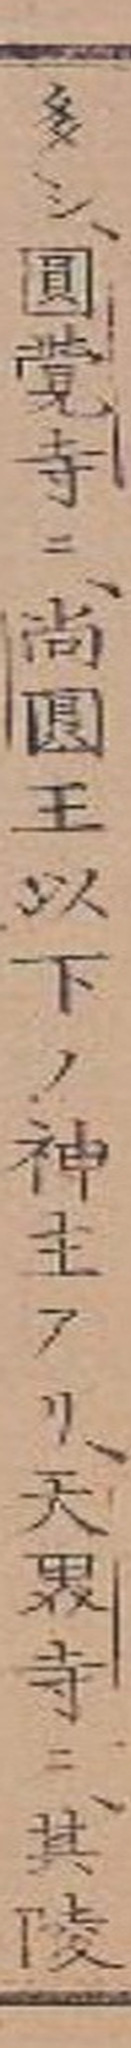多シ、円覚寺ニ、尚円王以下ノ神主アリ、天界寺ニ、其陵
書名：琉球新誌 巻上
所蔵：University of the Ryukyus Library
